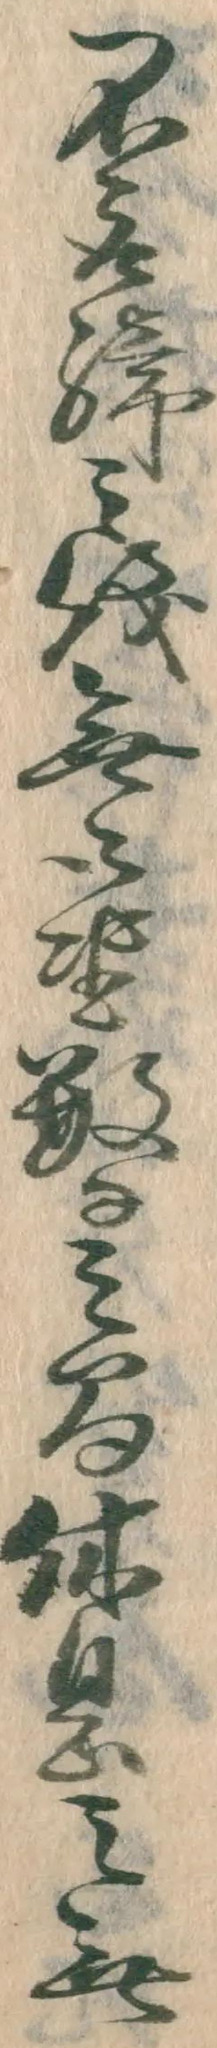不取締之儀無御坐数日之間休息之無

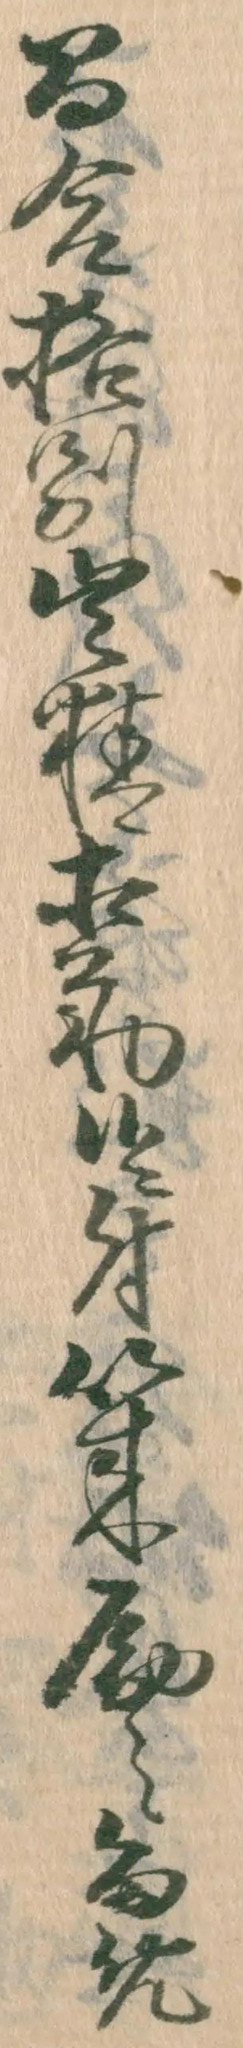間合格別出精相勤候ニ付以来励之ため
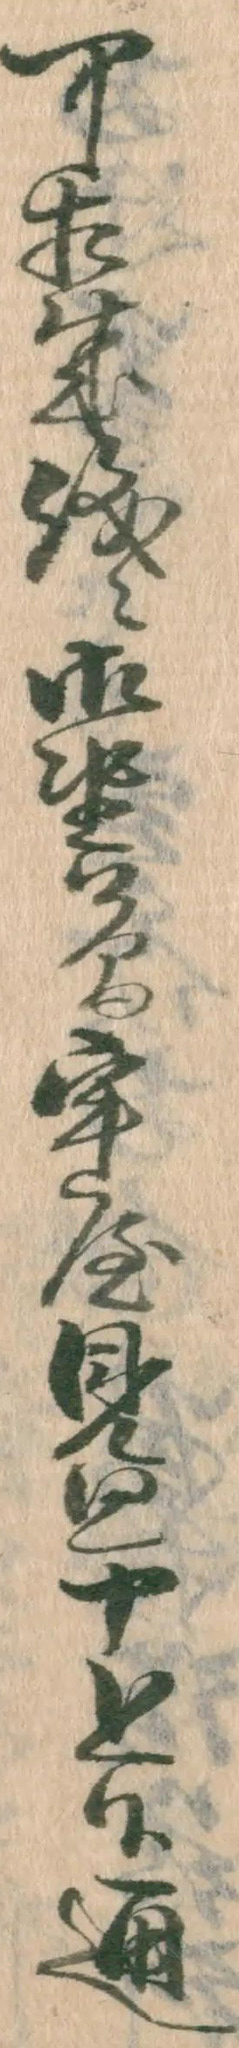可相成儀ニ御坐候間牢屋見廻申上候通
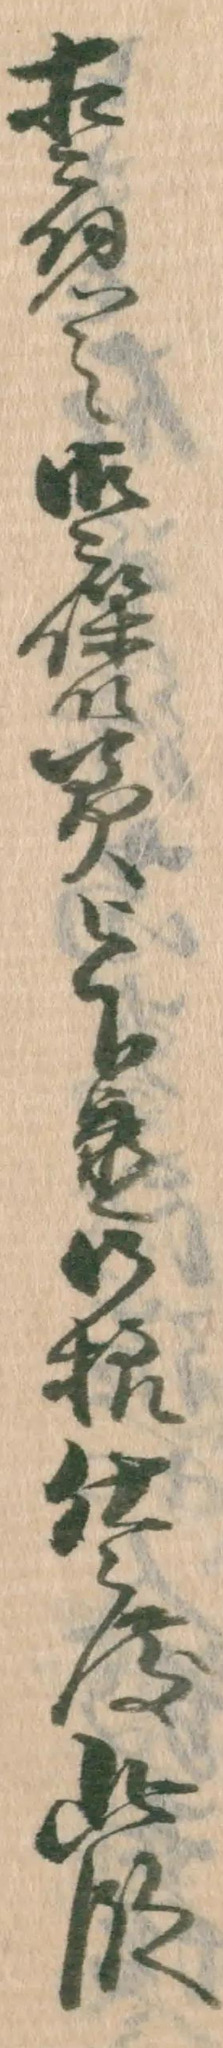相応之御褒美被下置候様仕度此段
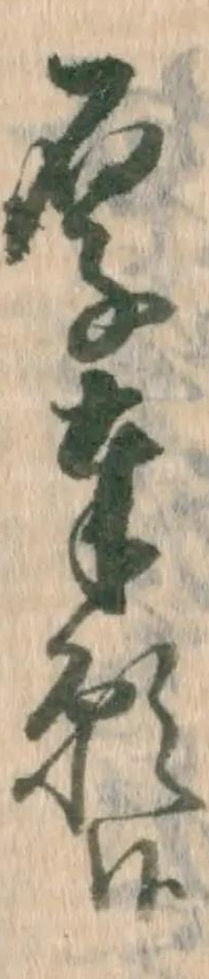厚奉願候
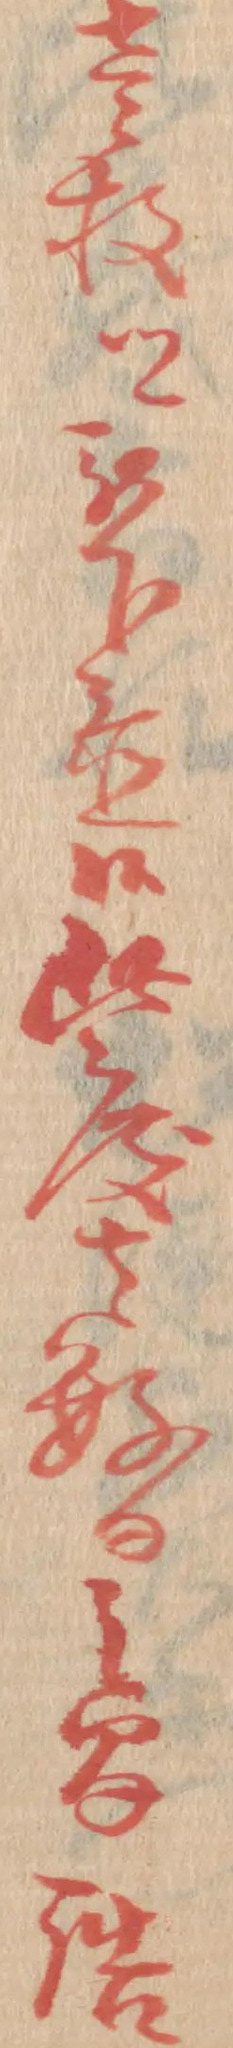壱枚ツヽ被下置候此度は数日之間詰

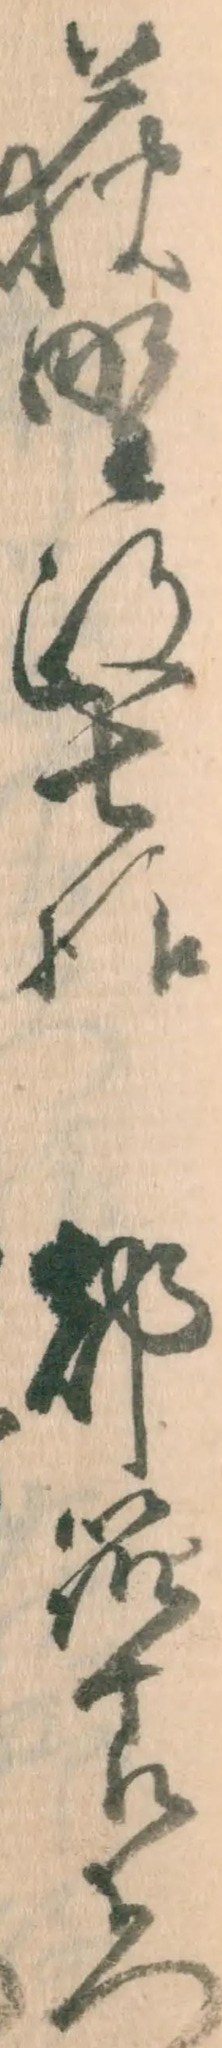荻野政七様都筑十左衛門
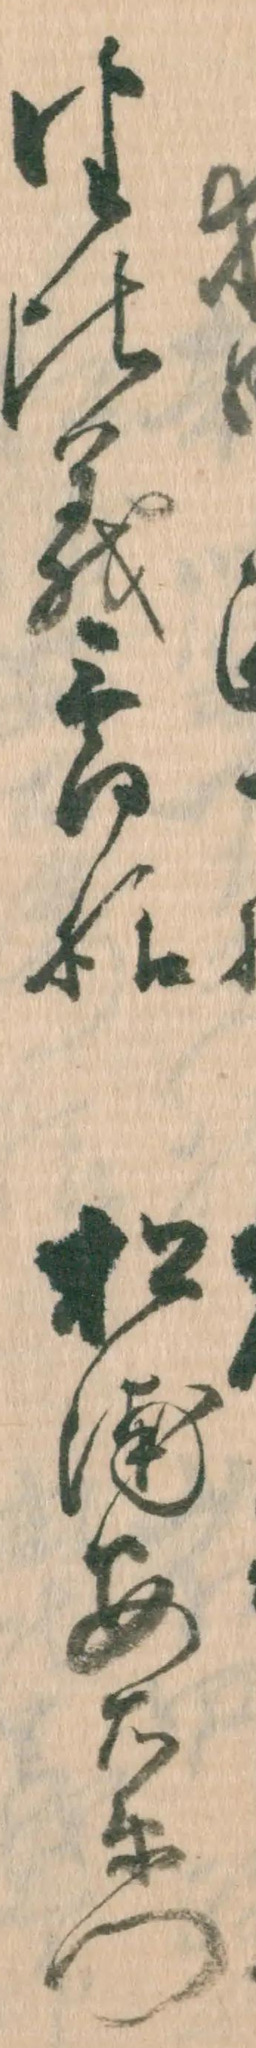由比義三郎様松浦安右衛門
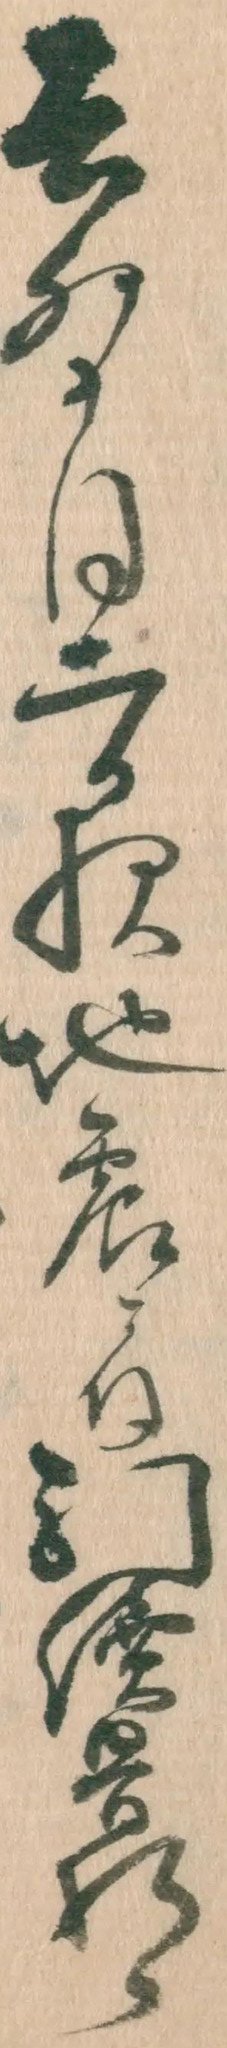去卯十月二日夜地震ニ付引続骨折候
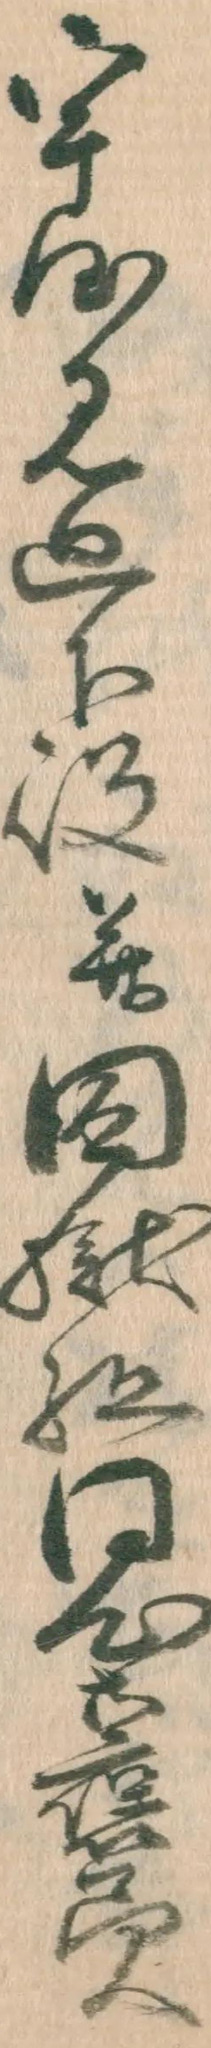牢屋見廻下役幷囚獄組同心御褒美
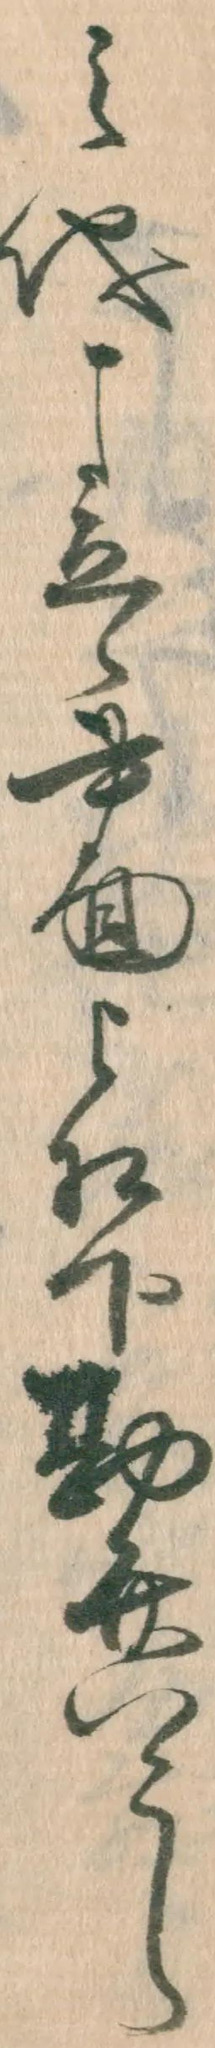之儀申立候書面被相下勘弁いたし
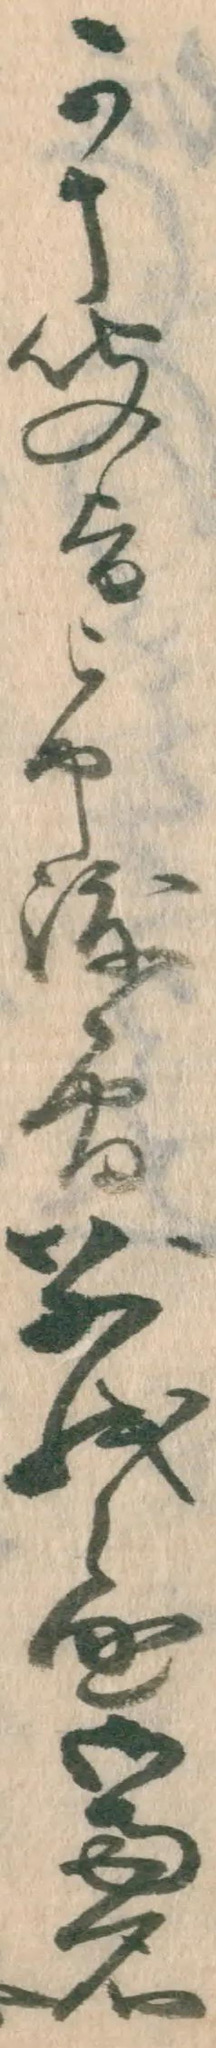可申聞旨被申渡候間別紙之通御当名
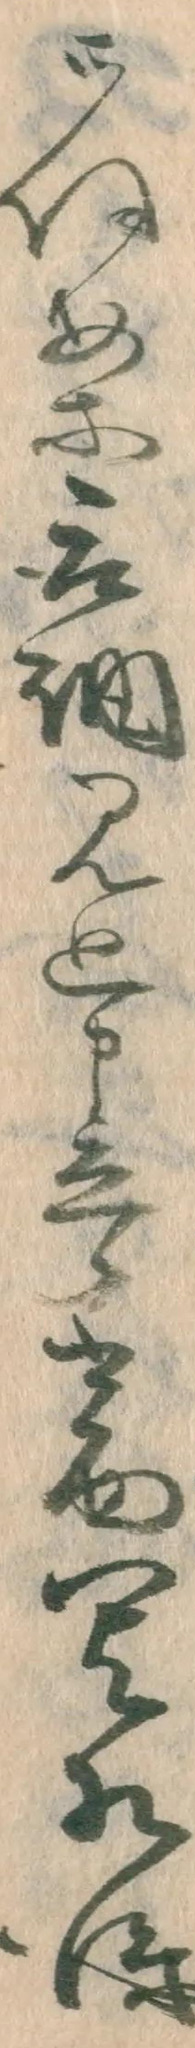御伺案取調上見廻申立之書面写相添

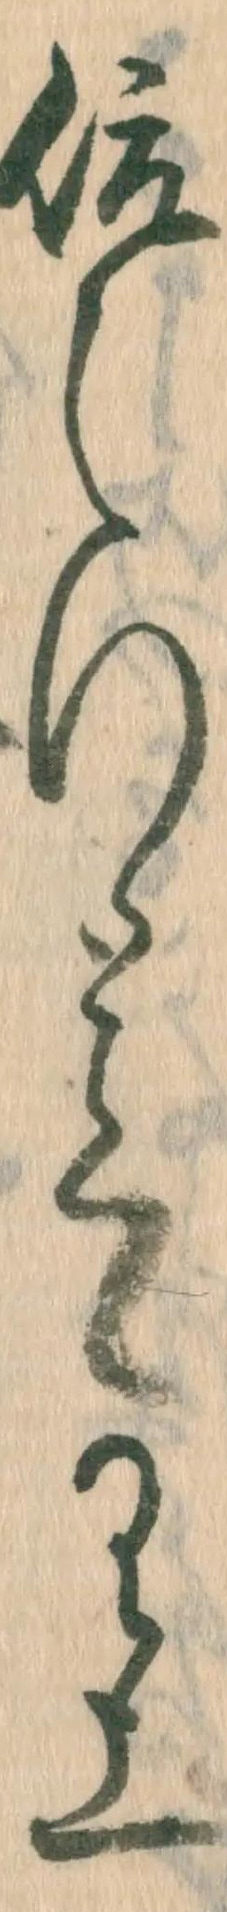依之得御意候已上
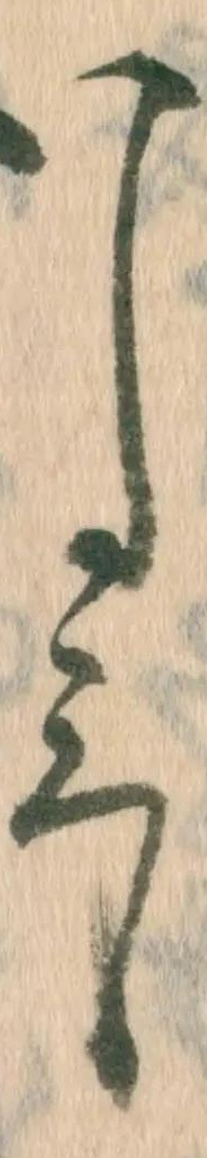八月三日
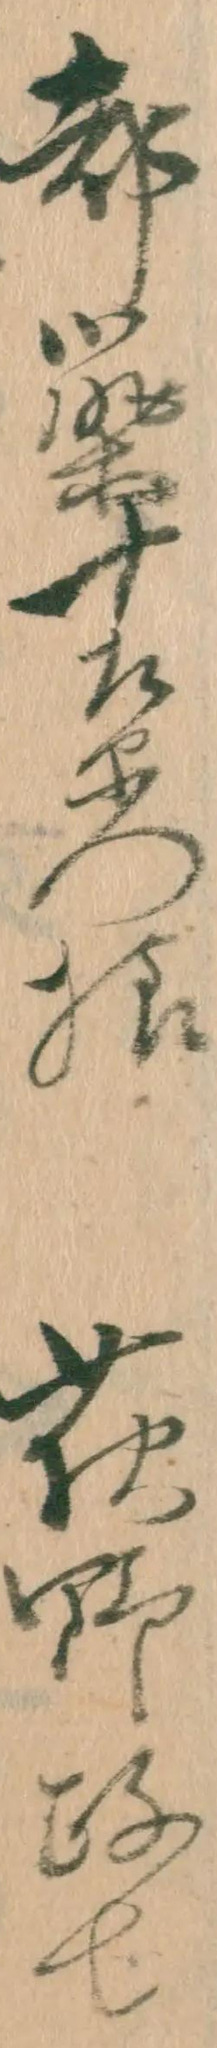都築十左衛門様荻野政七
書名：七十冊物類集 71巻. [44] 四十三 牢屋敷御普請御修覆地震ニ付骨折候牢屋掛御褒美之部
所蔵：国立国会図書館 National Diet Library, JAPAN
